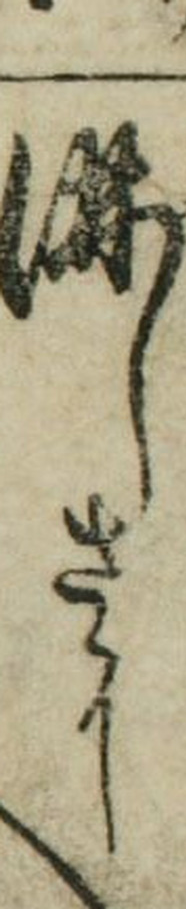淋しさに
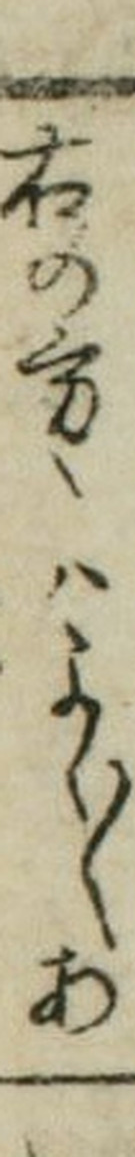右の方へはよく〳〵あ
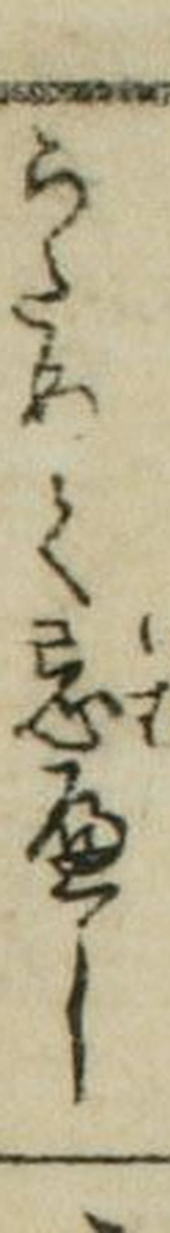らためて忌へし
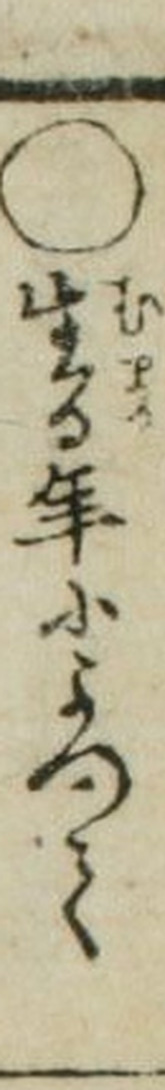○生る年によつて
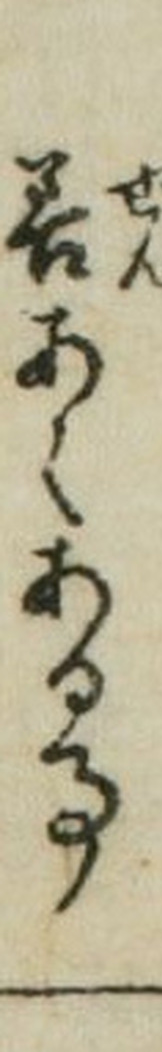善あくある事
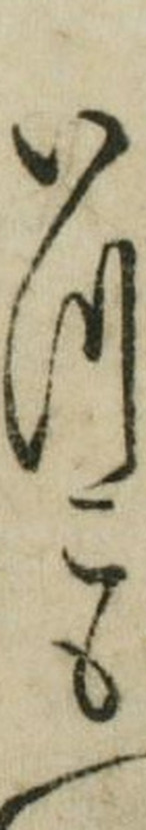いづこも
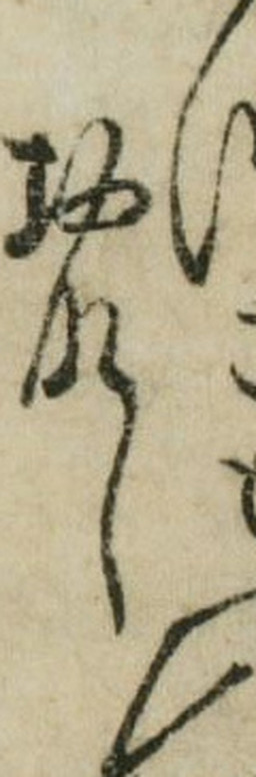おなし
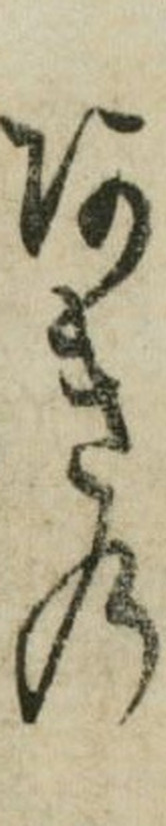あきの
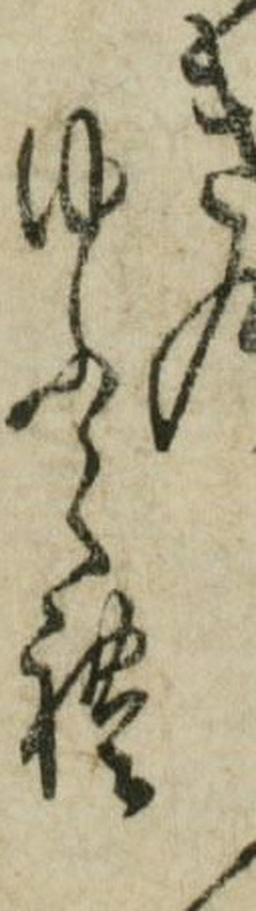ゆふくれ
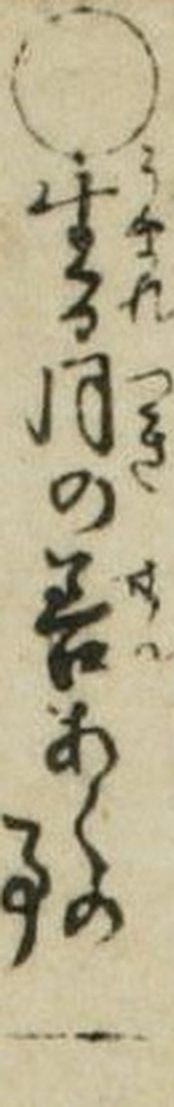○生る月の善あくの
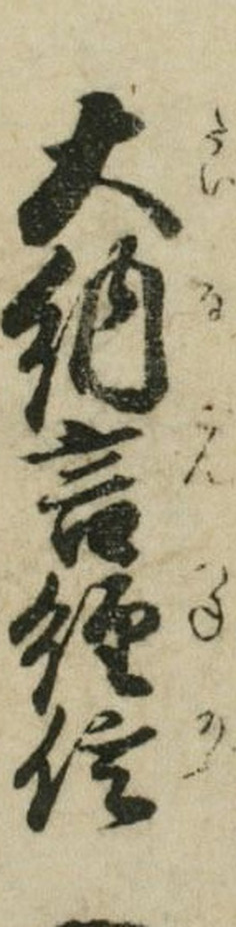大納言経信
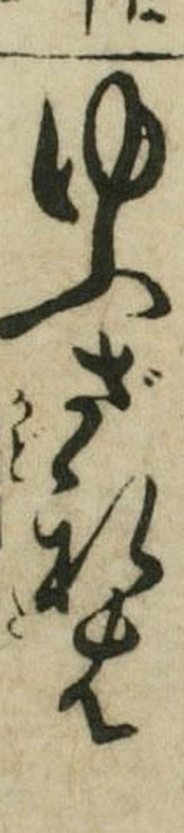ゆふざれは
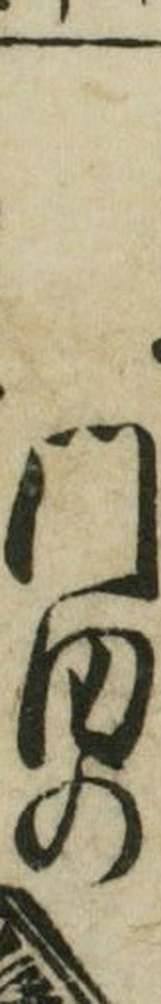門田の
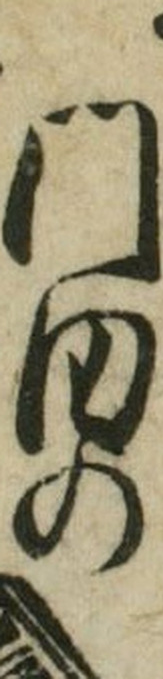門田の
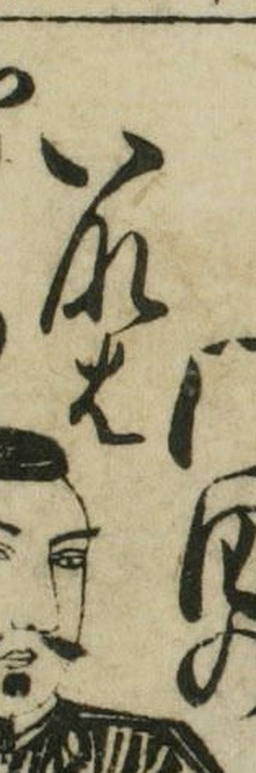いなは
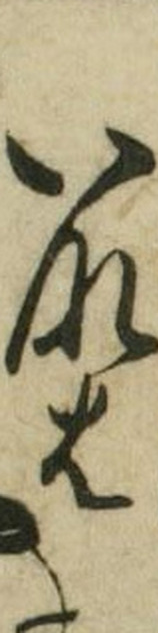いなは
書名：百人一首
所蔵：東京学芸大学教育コンテンツアーカイブ
